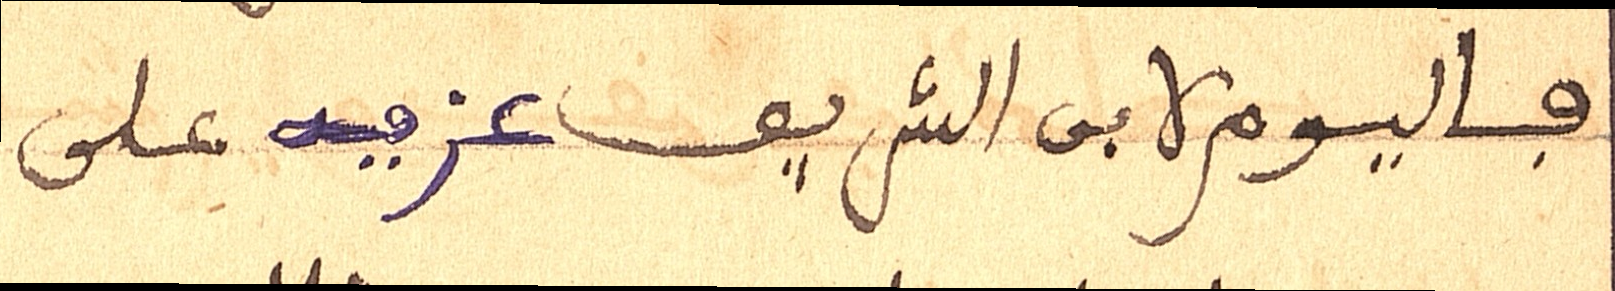فاليوم لابن الشريف عزفه على
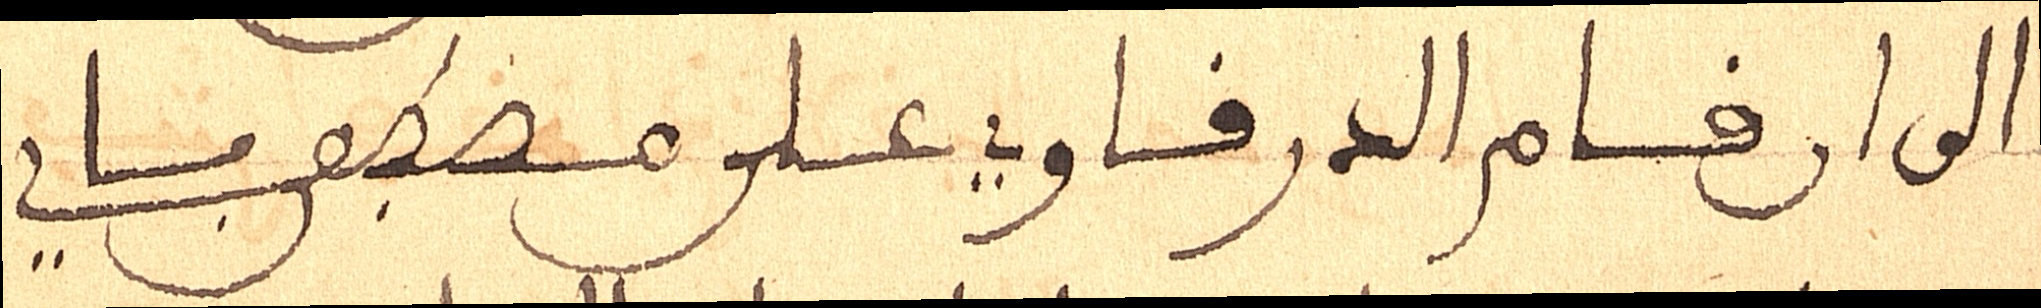الى ان قام الدرقاوي على مصطفى باي
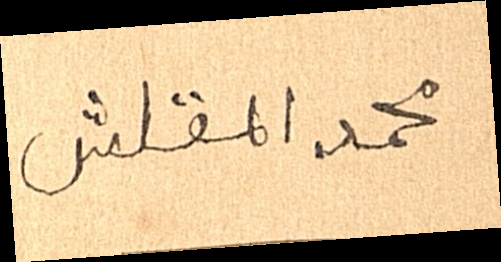محمد المقلش
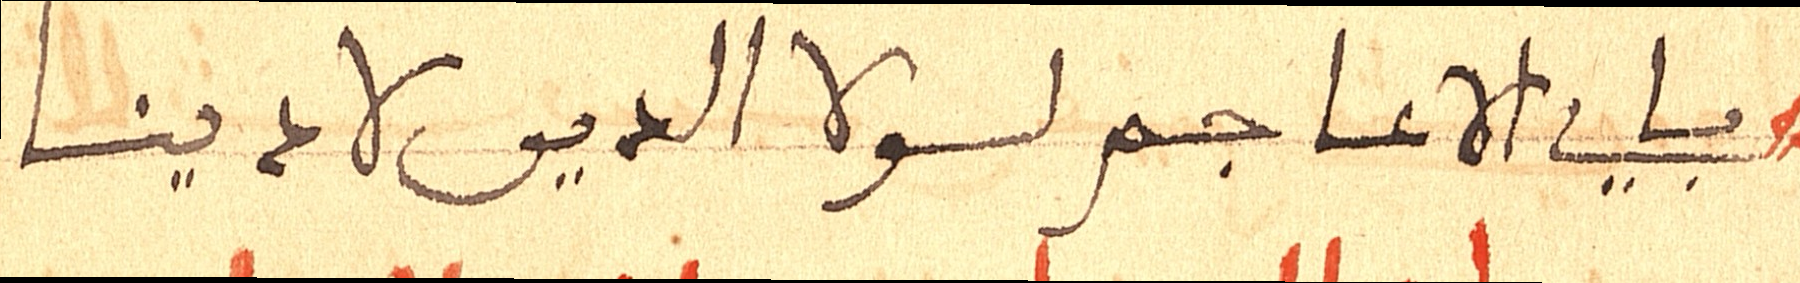باي الاعاجم لولا الدين لا دينا
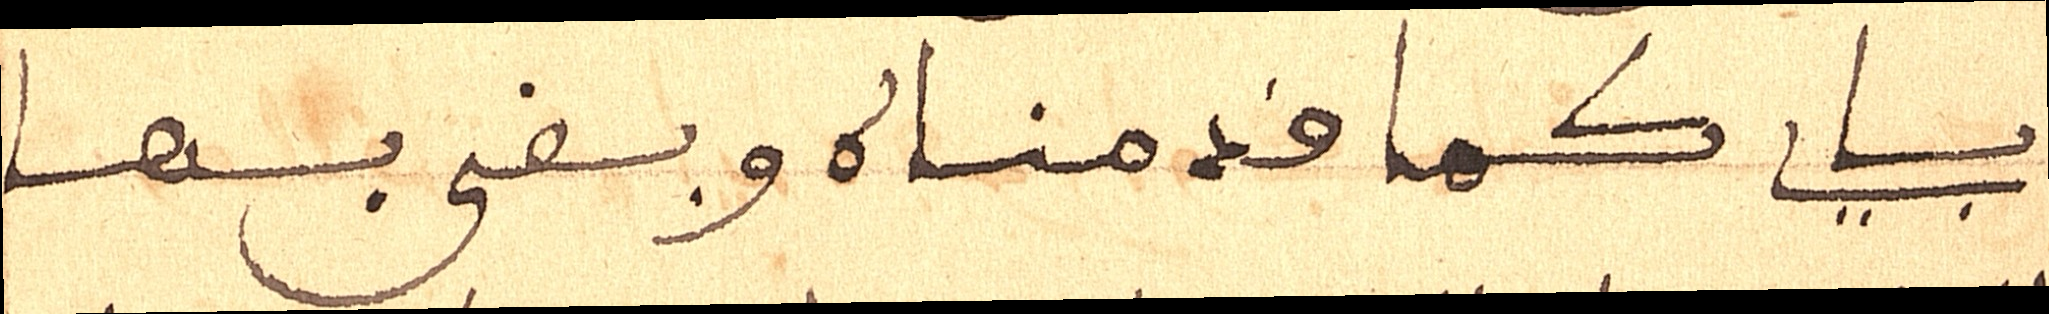باي كما قد مناه وبقى بها
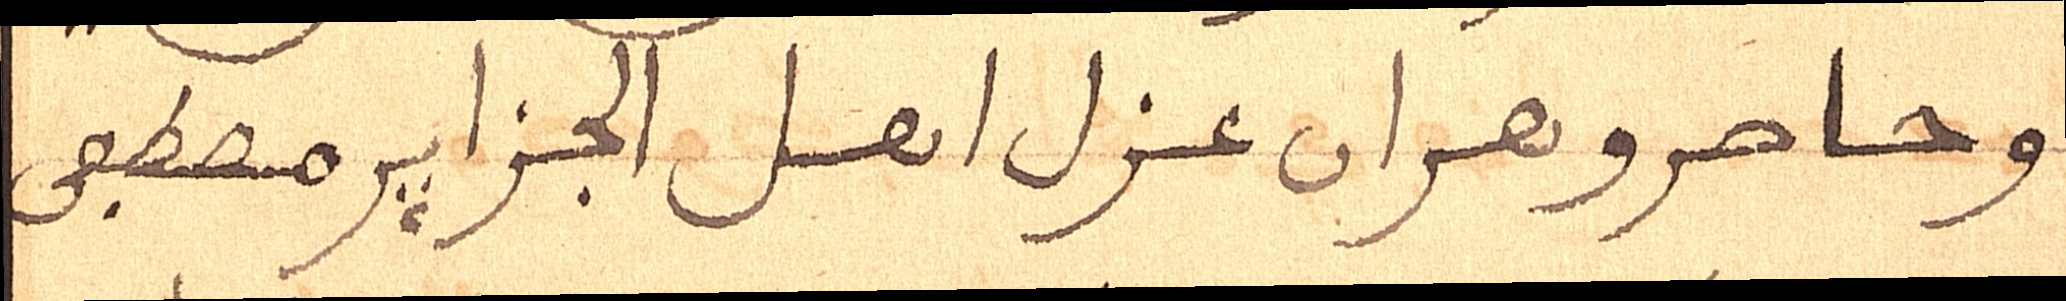وحاصر وهران عزل اهل الجائر مصطفى
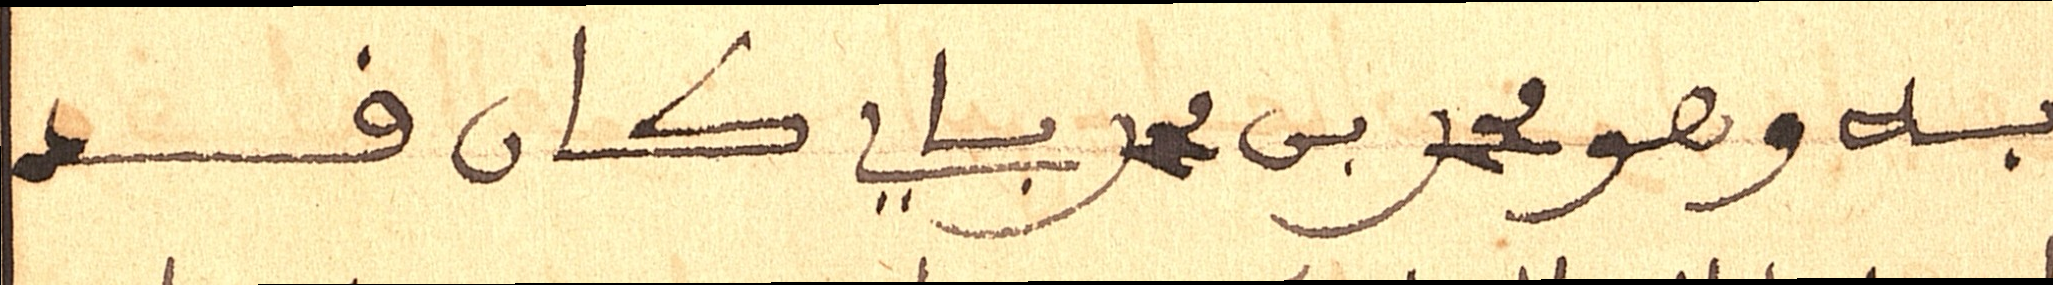به وهو محمد بن محمد باي كان قد
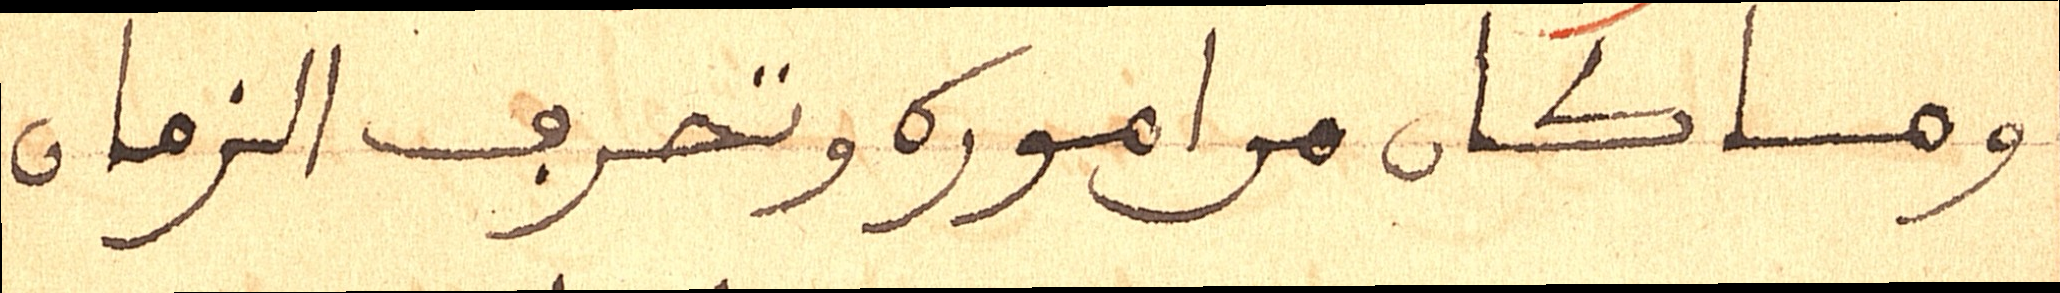وما كان من اموره وتصرف الزمان
